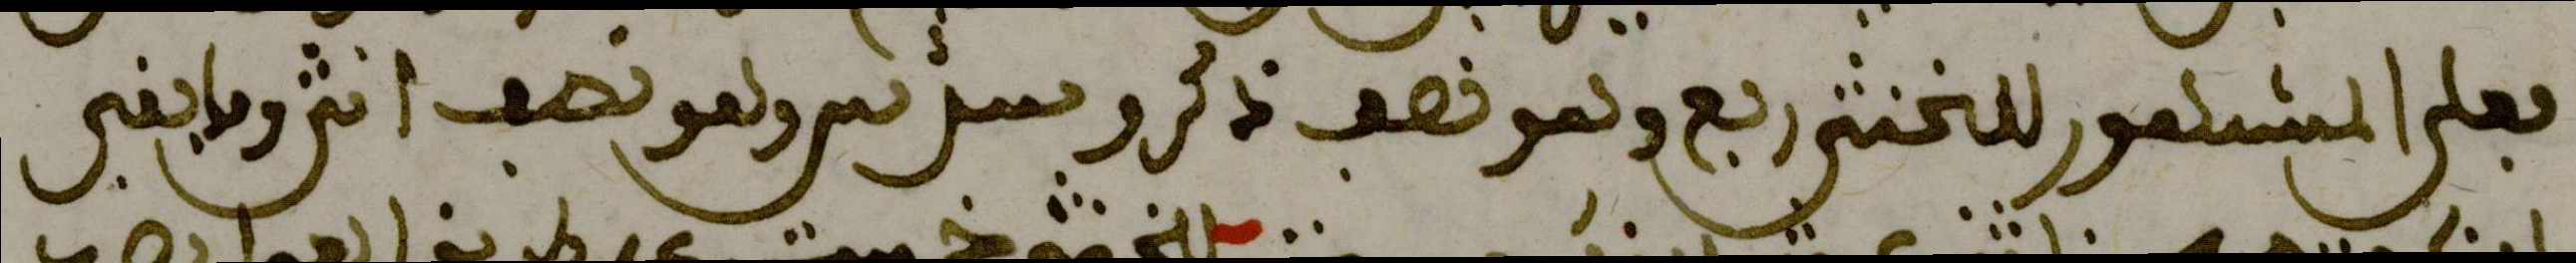فعلى المشهور للخنثى رجع وهو نصف ذكر وسدس وهو نصف انثى وما بفي
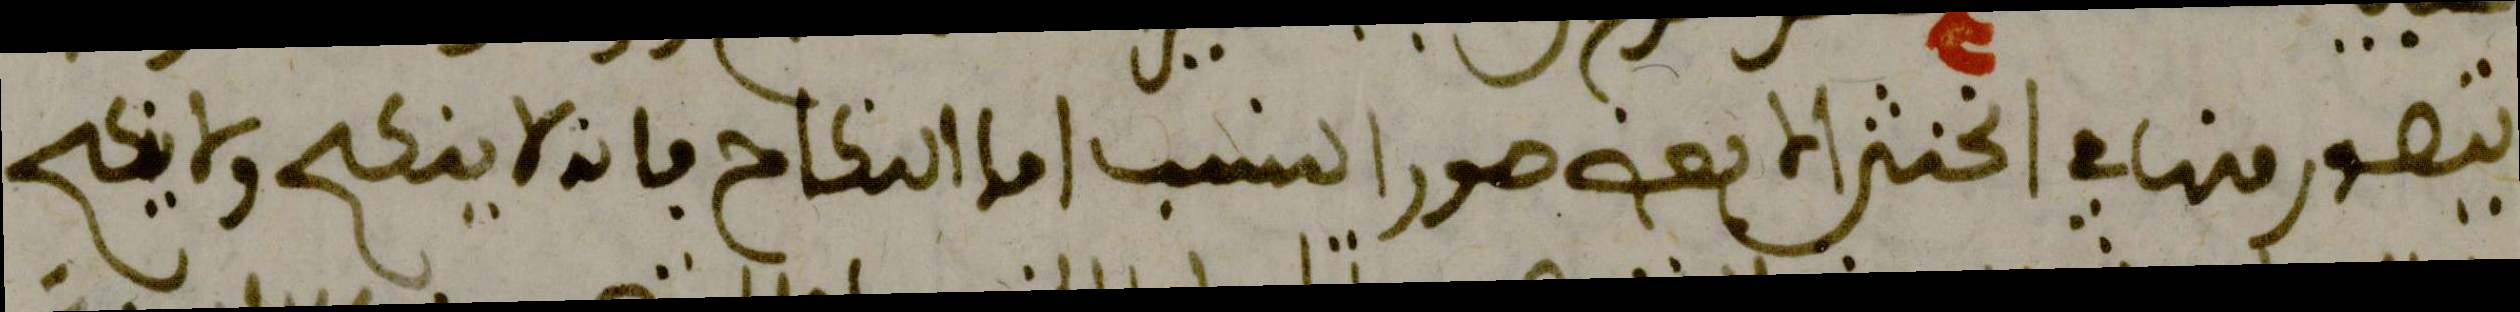يتصور منها في الخنثى الا بعض صور النسب اما النكاح فانه لا ينكح ولا ينكح
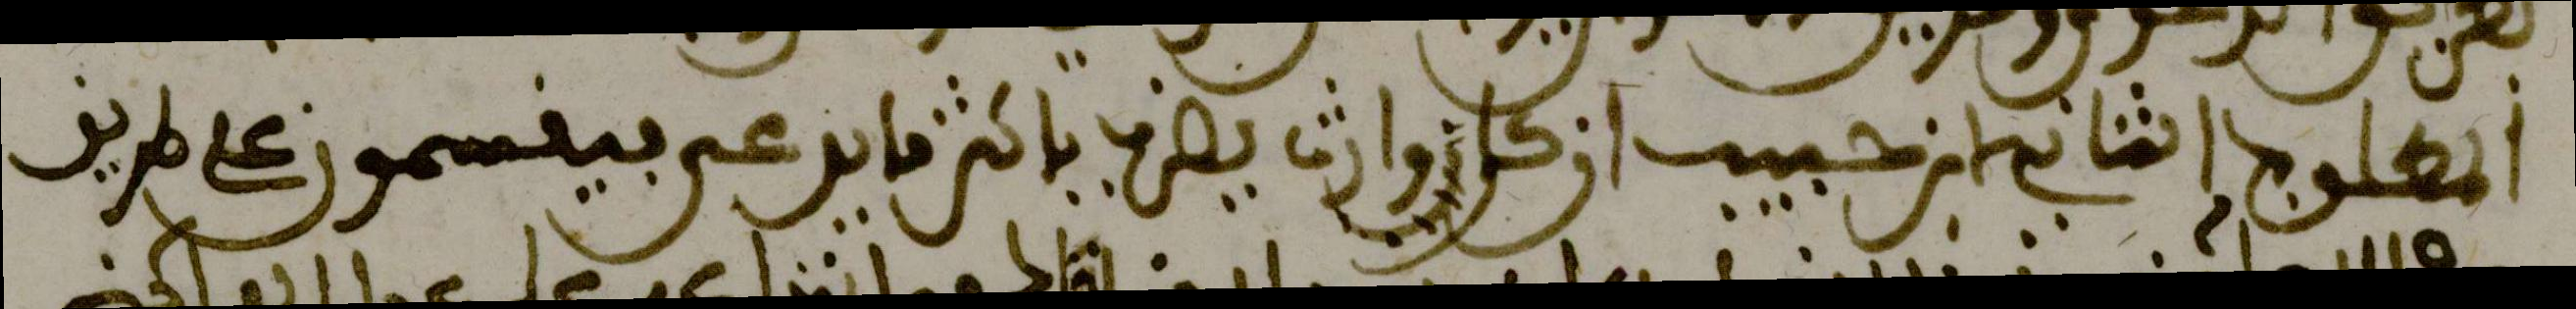المطلوب الثاني لابن حبيب ان كل روارث يضرب باكثر ما يدعى فيقسمون على طريق
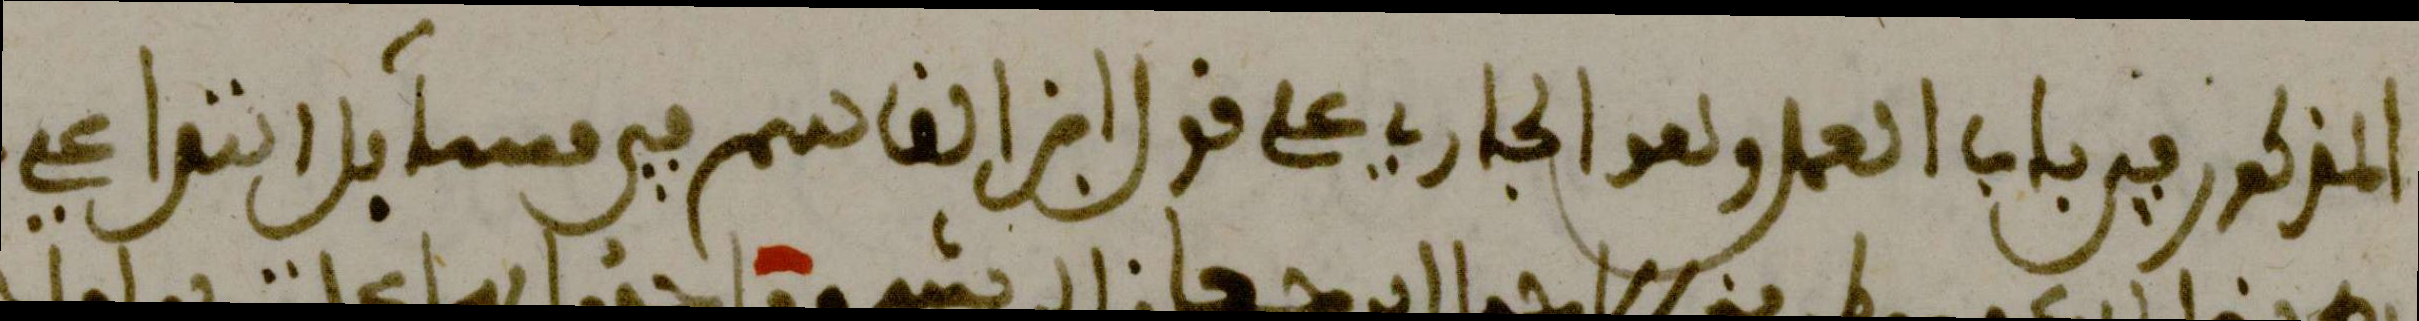المذكور في باب العمل وهو الجاري على قول ابن القاسم في مسائل التداعي
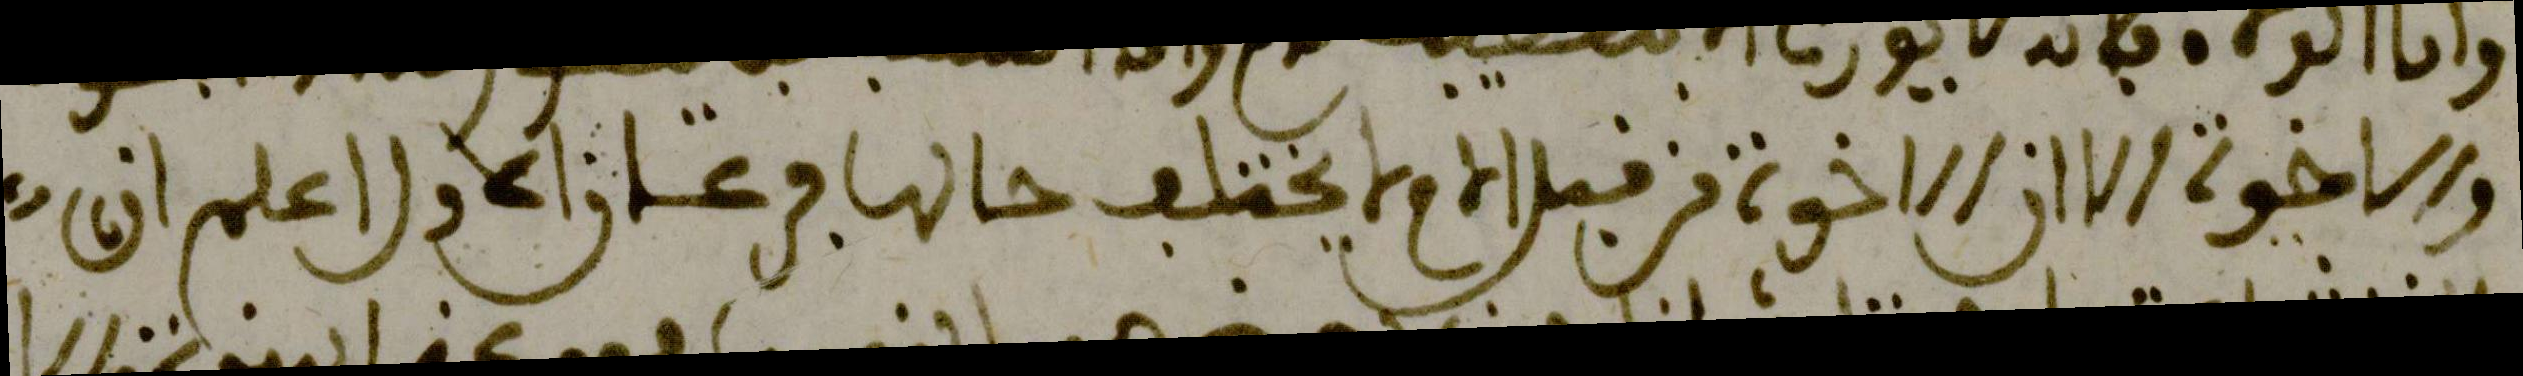والاخوة الا ان الاخوة من قبل الام لا يختلف حالها فرعان الاول اعلم ان
